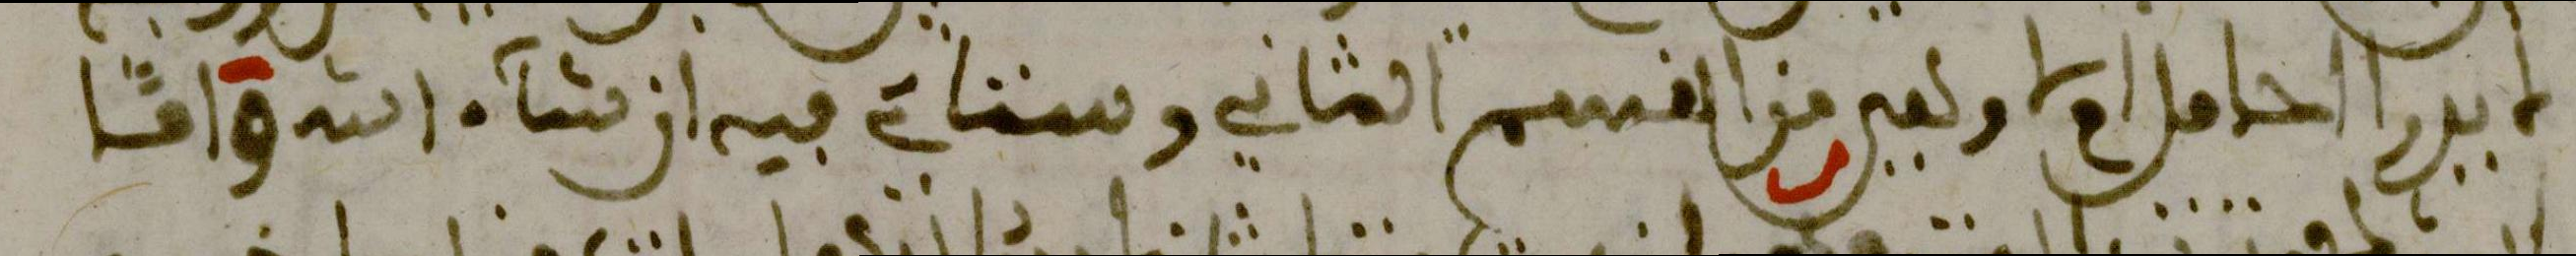لا يدرا احامل ام لا وهي من القسم الثاني وستاتي فيه ان شاء الله وامّا
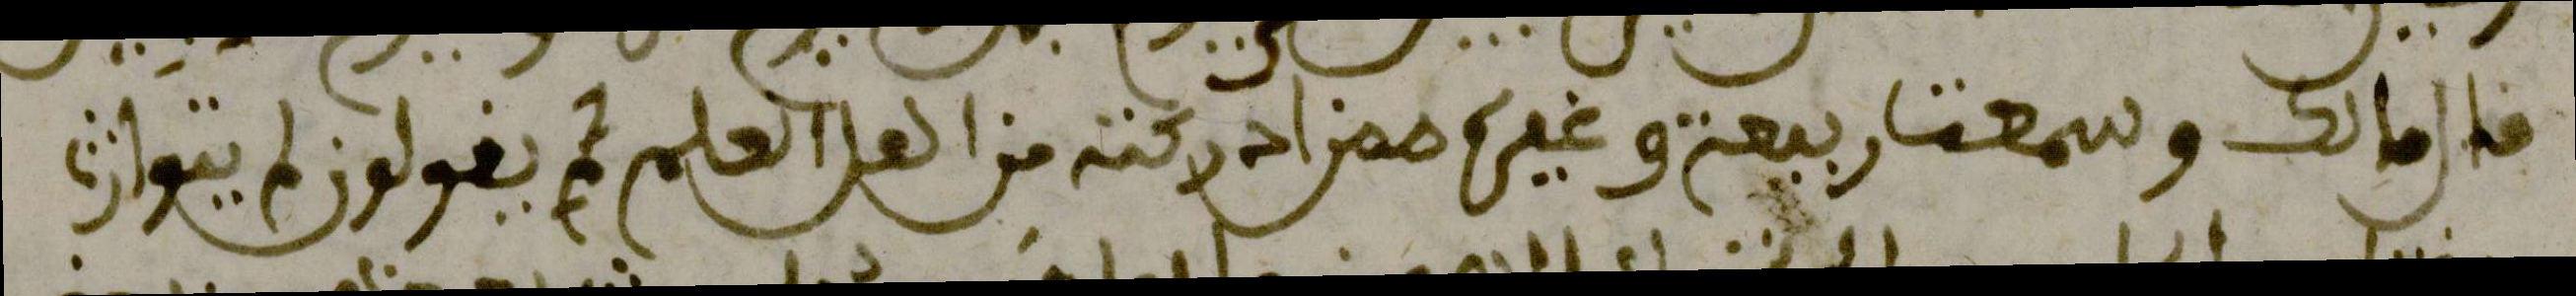قال مالك وسمعت ربيعة وغيره ممن ادركته من اهل العلم لم يقولون لم يتوارث
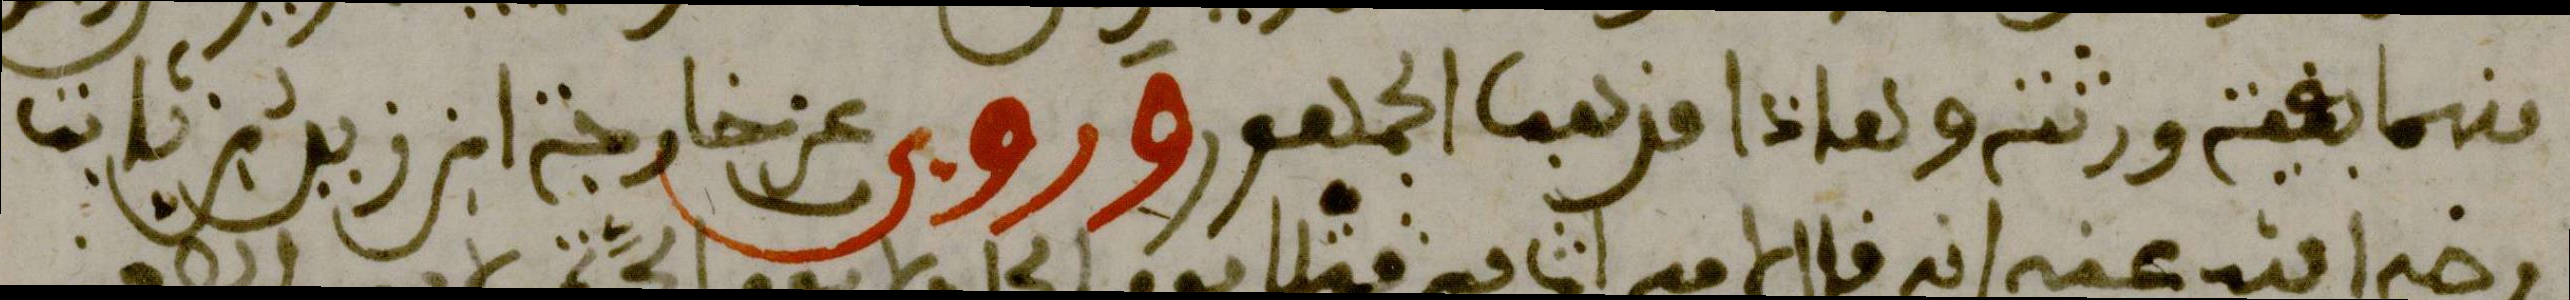منهما بقية ورثته وهاذا مذهب الجمهور وروى عن خارجة ابن زيد بن ثابت
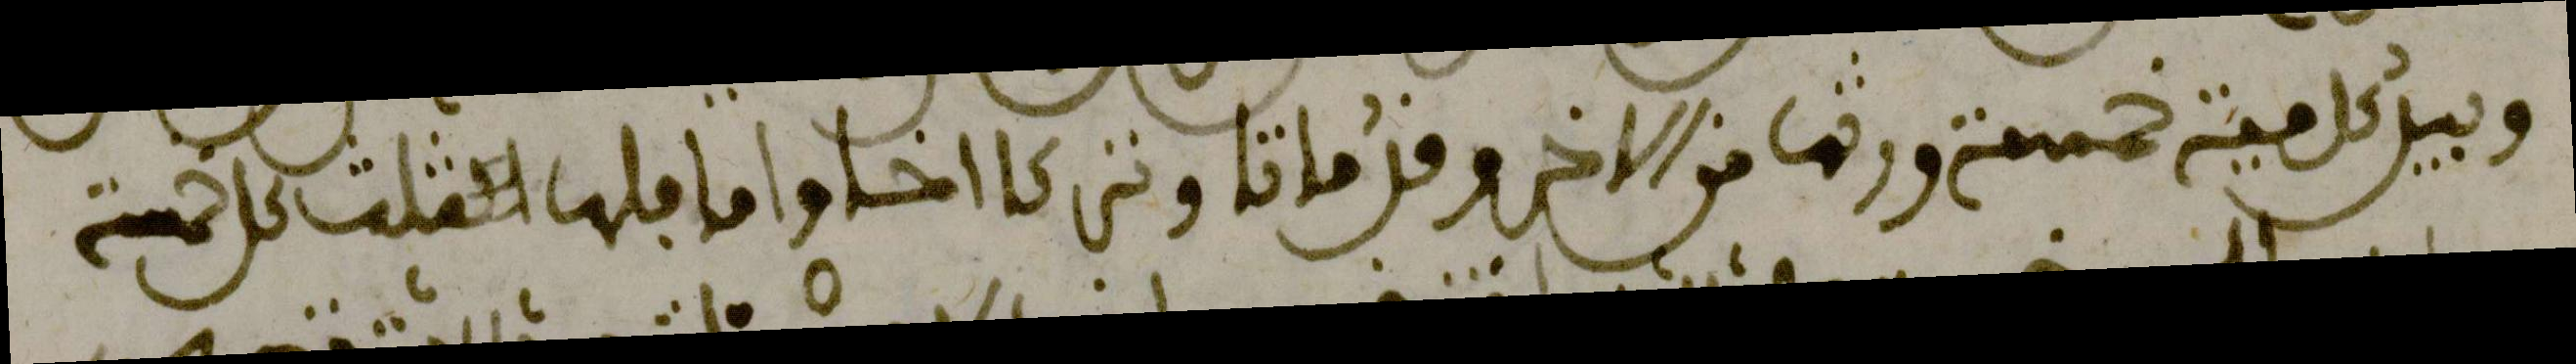وبيد كل ميت خمسة ورثها من الاخر وقد ماتا وتركا اخا واما فلها الثلث كل خمسة
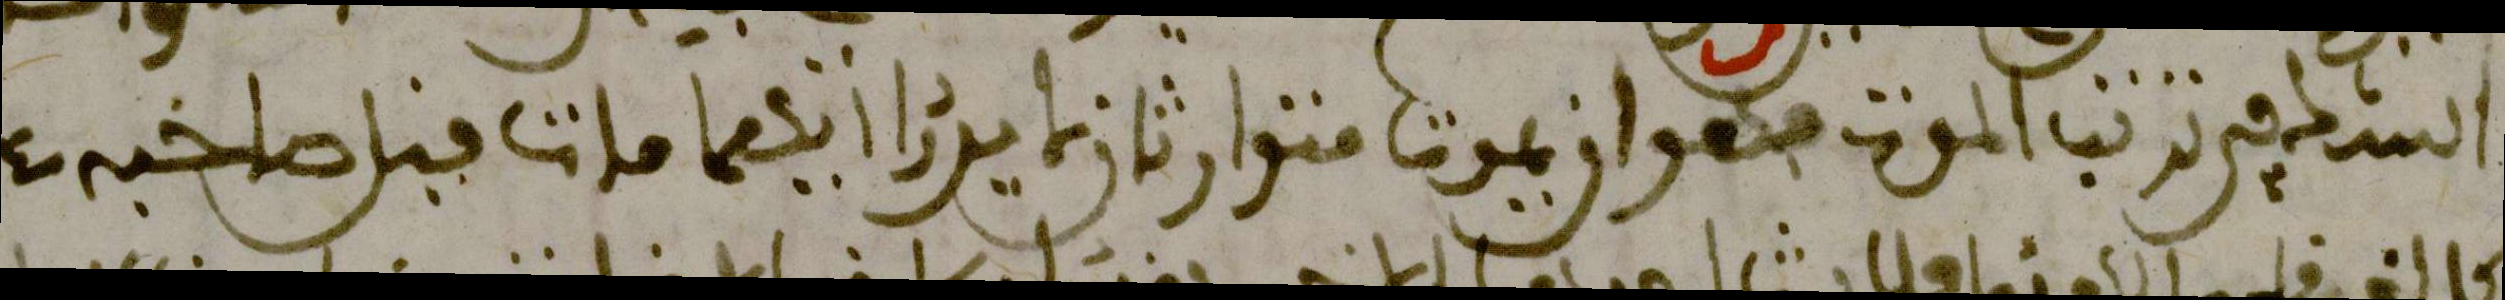الشد في ترتب الموت فهو ان يموت متوارثان لا يدرا ايهما مات قبل صاخبه
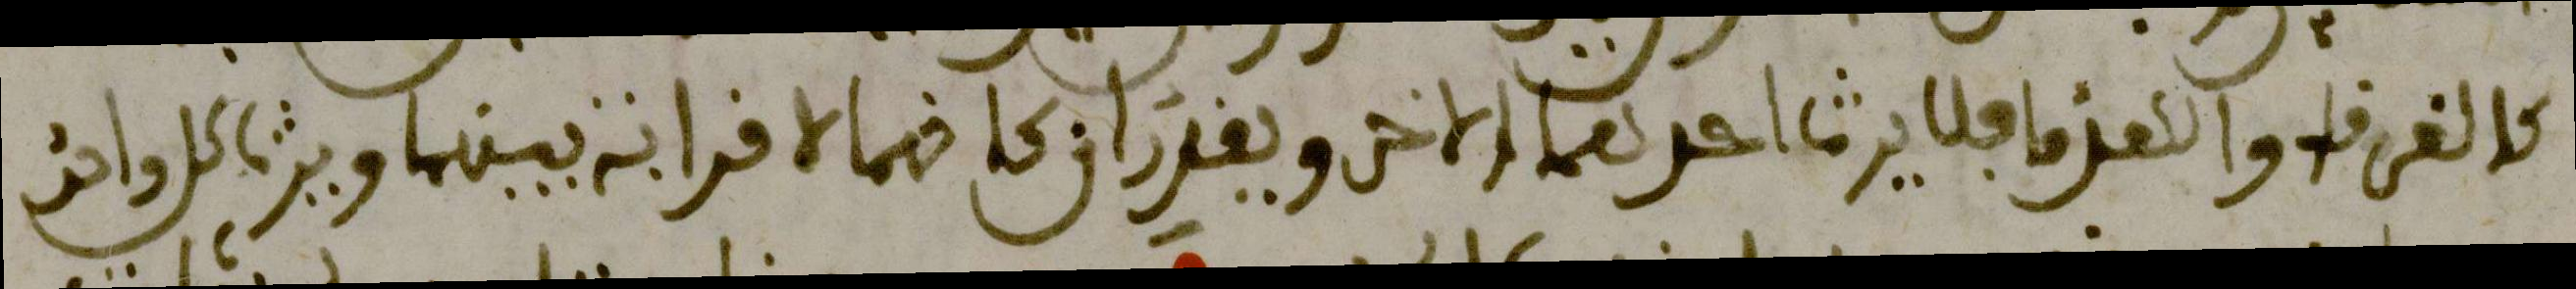كالغرقا والهدما فلا يرث احدهما الاخر ويقدران كانها لا قرابة بينها ويرث كل واحد
